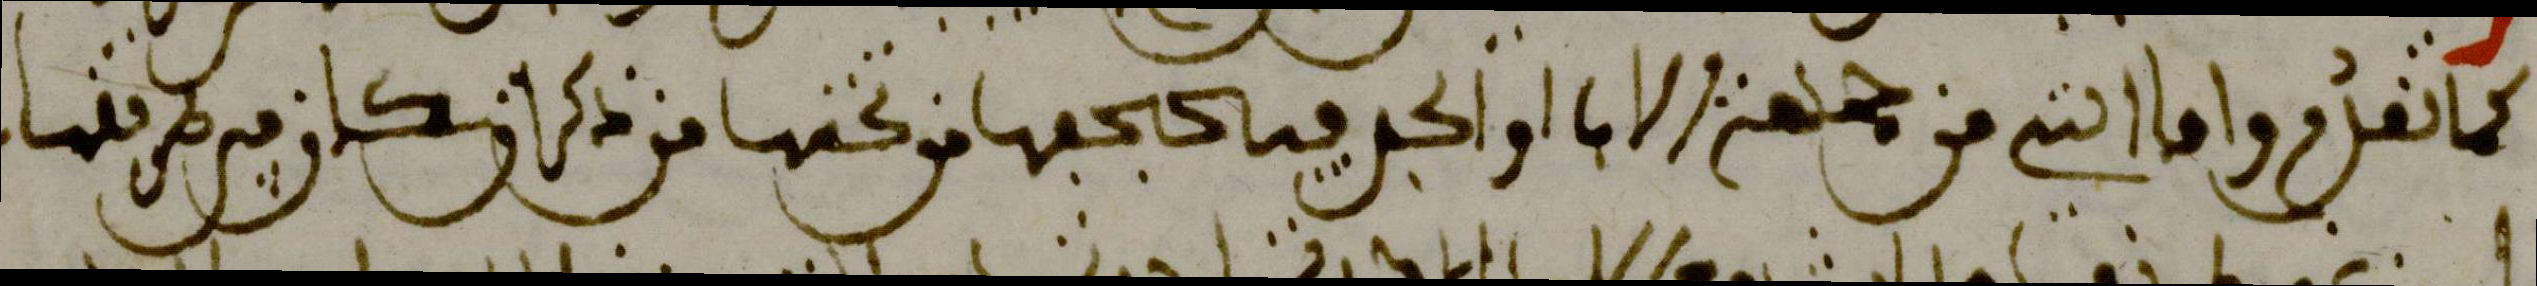كما تقدم وام التي من جهة الاب او الجد فيحجبها من تحتها من ذكر ان كان في طريقها
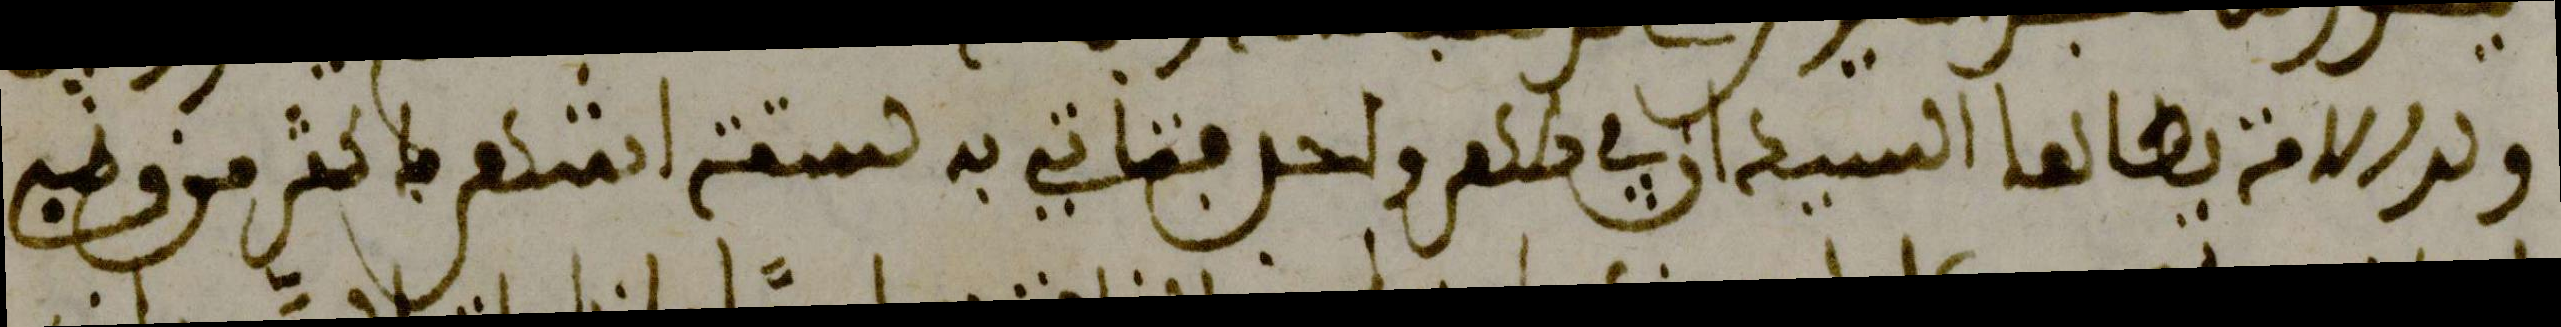ولد الامة يطاها السيدان في طهر واحد فتاتي به لستة اشهر فاكثر من وطئ
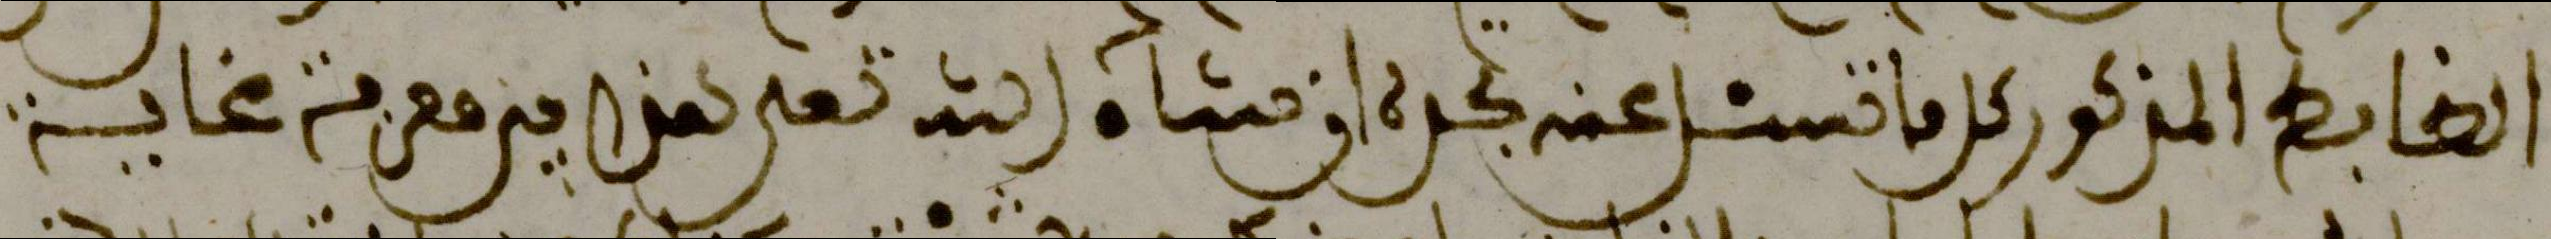الضابط المذكور كل ما تسئل عنه تجده ان شاء الله تعلى هذا في معرفة غاية
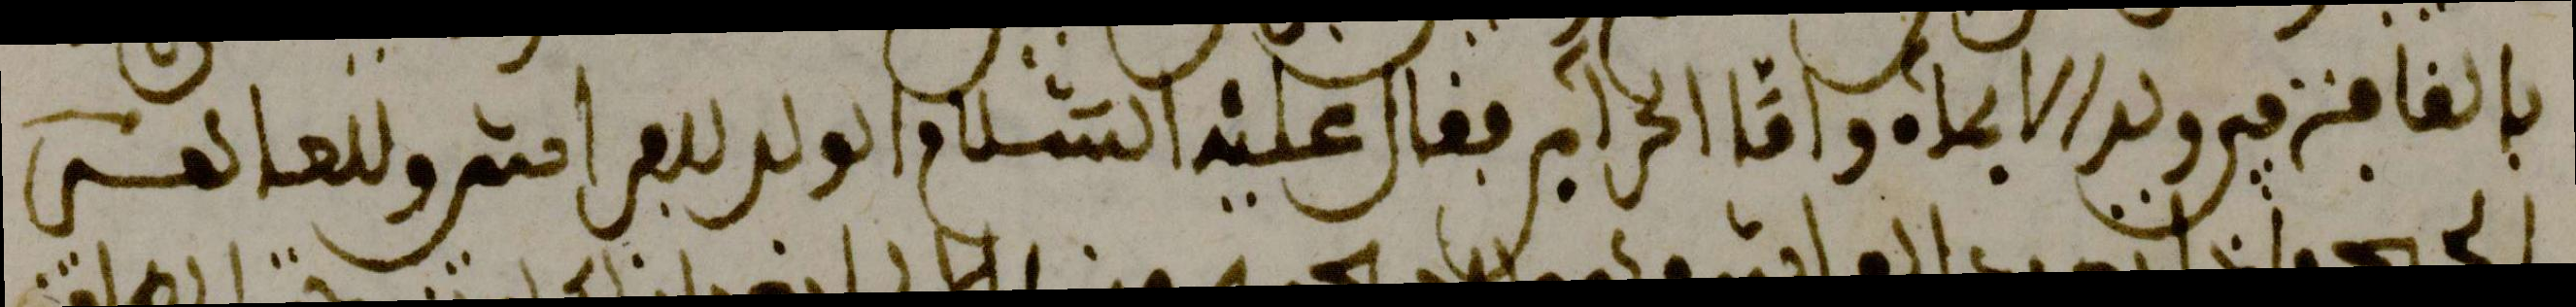بالقافة في ولد الاماء وامّا الحرائر فقال عليْه السّلام الولد للفراش وللعاهر
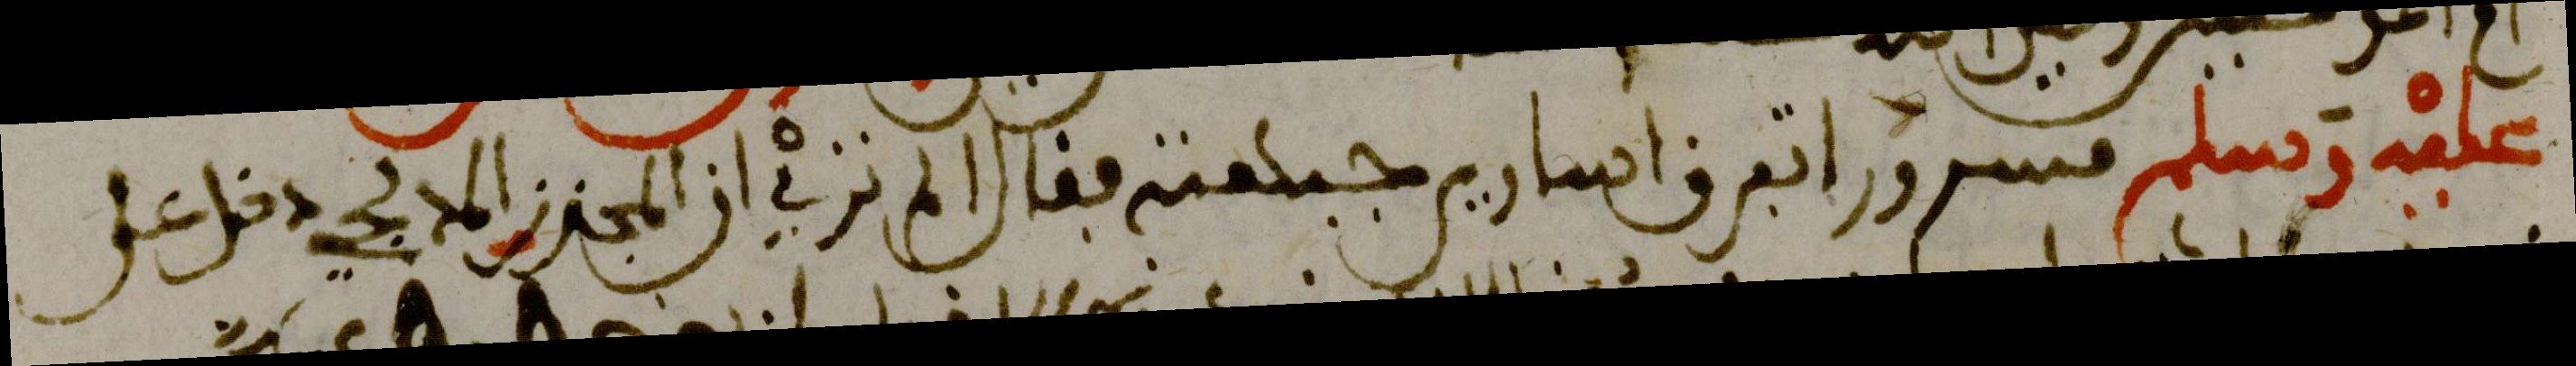عليْه وَسلم مسروُرا تبرق اسارير جبهته فقال الم تريْ ان المجزز # دخل على
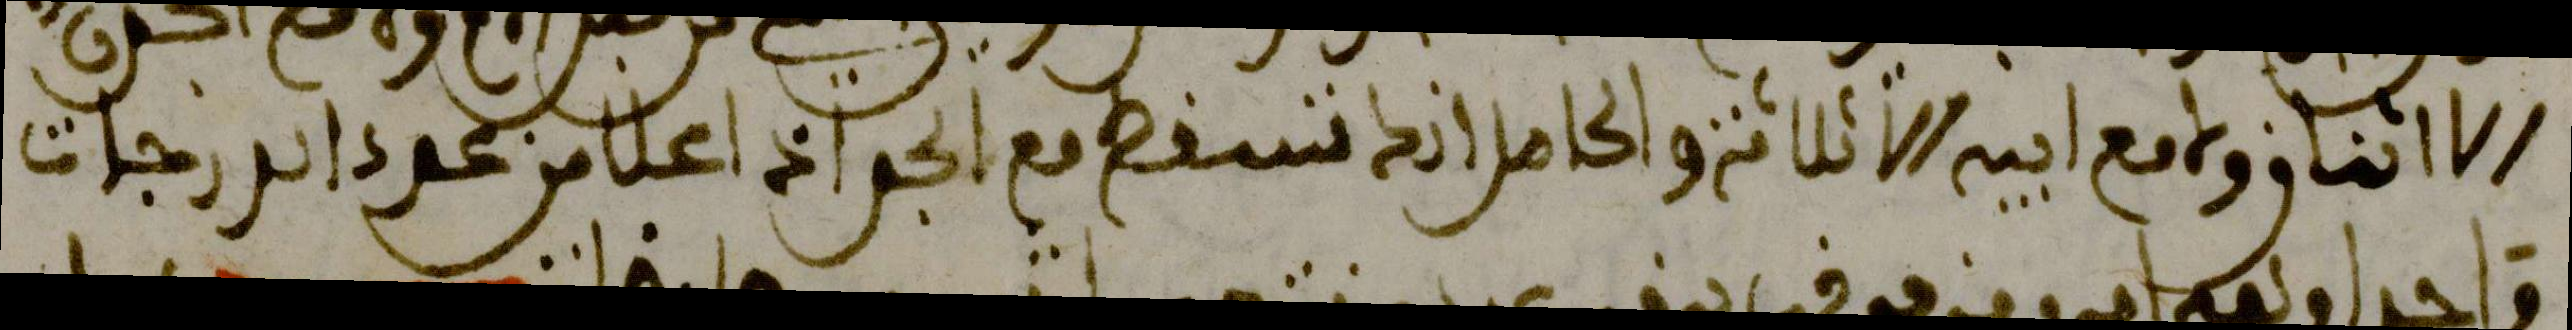الا اثنان ولا مع ابيه الا ثلاثة والحاصل انك تسقط مع الجد اذا علا من عدد الدرجات
